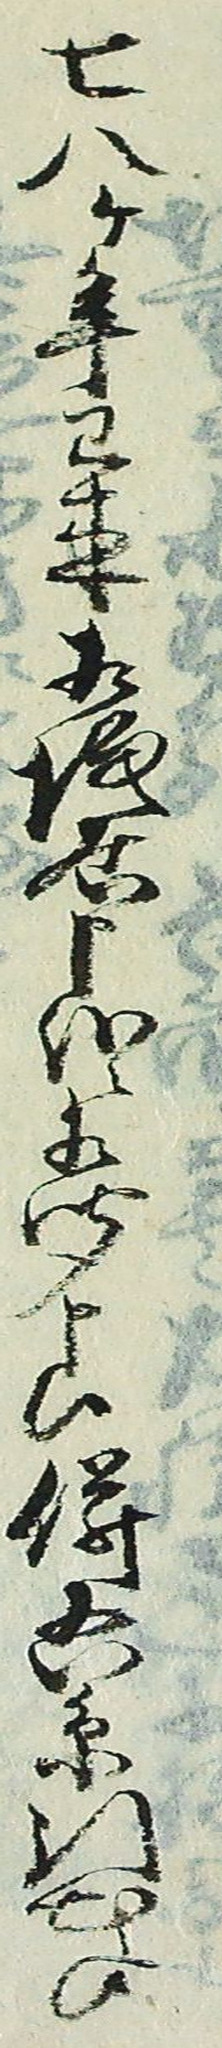七八ケ年已来相増居申哉に相聞申候併右糸引出候
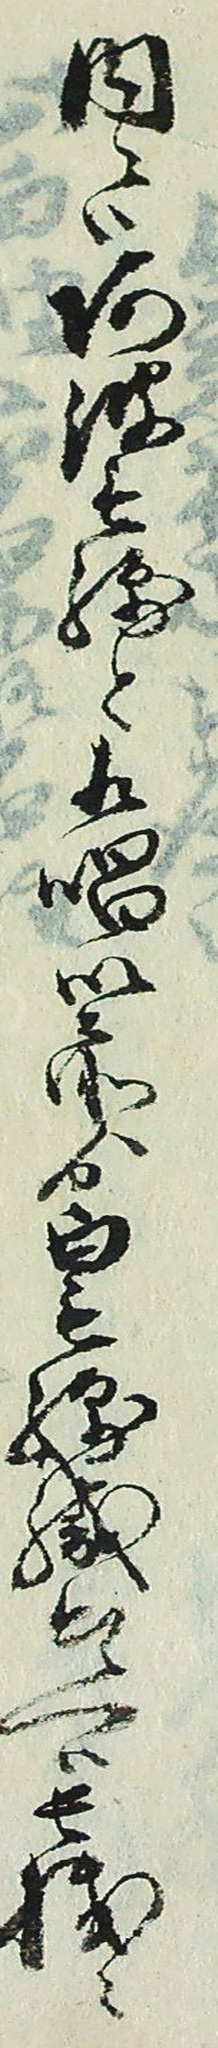内には阿波毛綿と相唱以前ゟ白毛綿織出候へは長機に
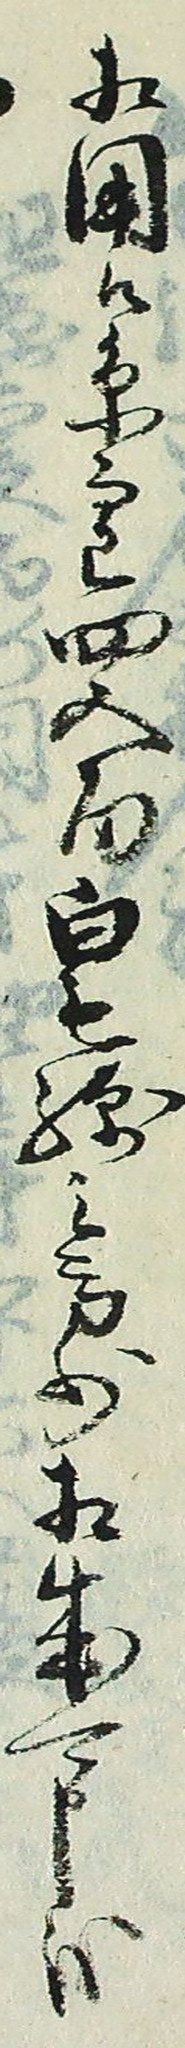相用候糸而已四五百白毛綿之方少相成可申哉
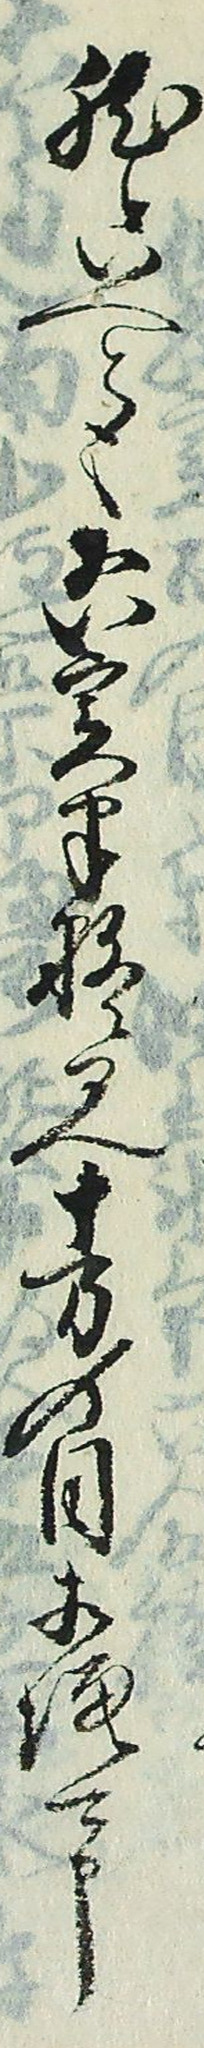然といへとも右実半数に見十万〆目相増可申
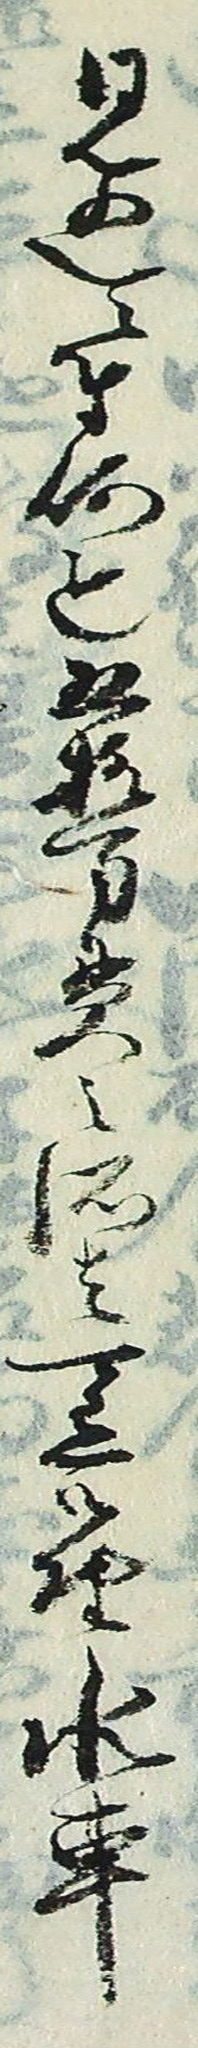見込に付何れ五拾万貫之所者可有御坐水車
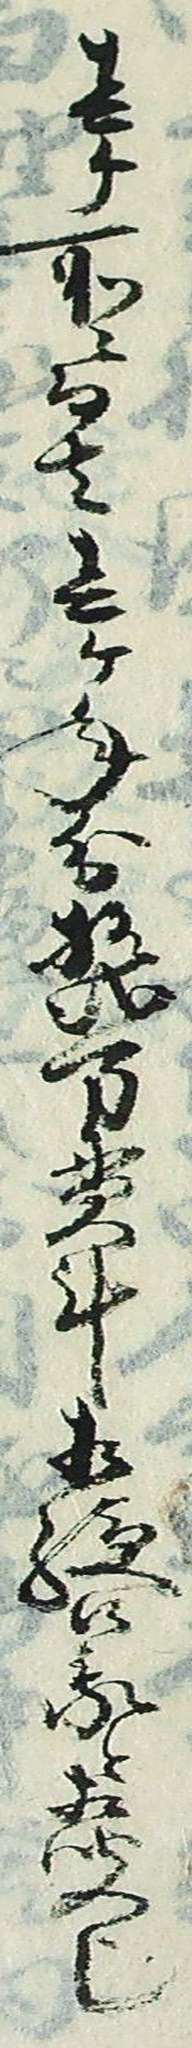壱ケ所に而者壱ケ年分拾弐万貫計相絞候義と相聞申候
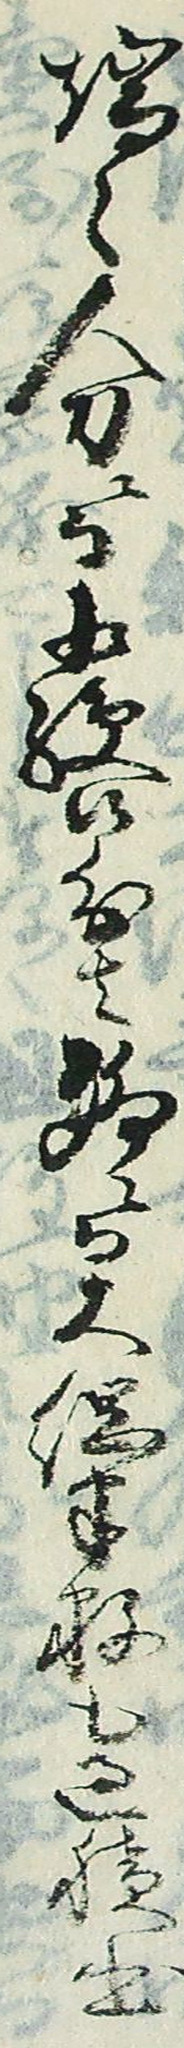端々人力に而相絞候分者聊に而大綱半数も過積出
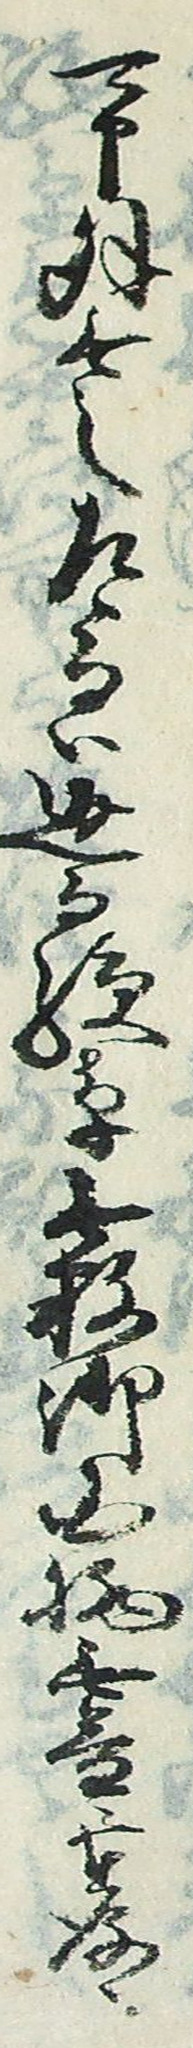可申外無之左候而は返而絞草無数御国柄無益に奉存候

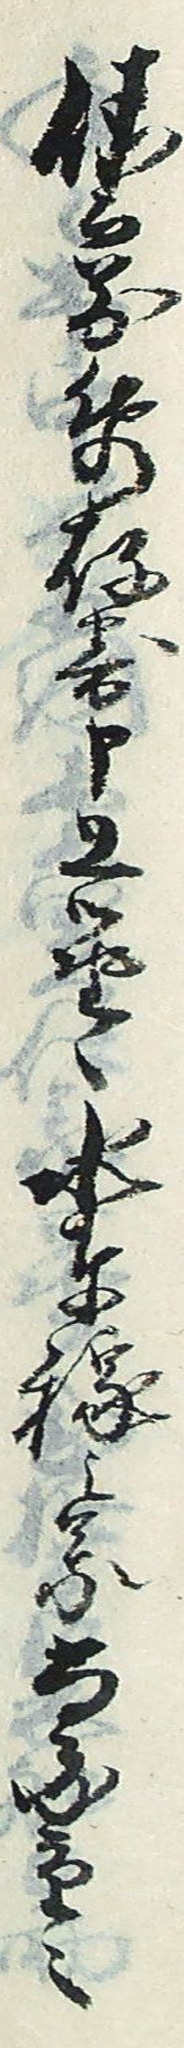依而別帋存寄申上御坐候水車稼之義尚亦重々
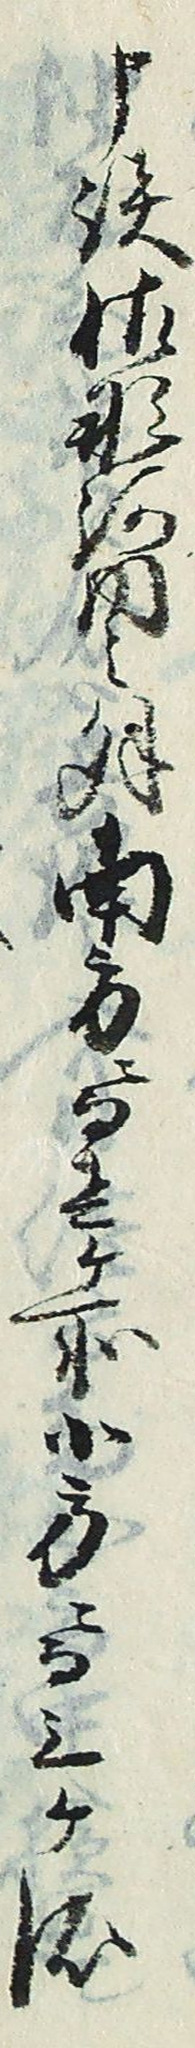申談佐那河内之外南方に而壱ケ所北方に而三ケ所
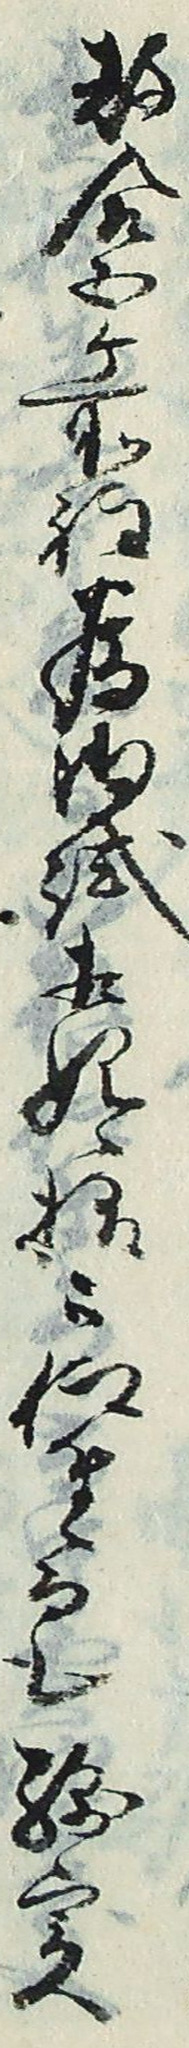都合五ケ所程為御試相始候様被仰付候而も綿実
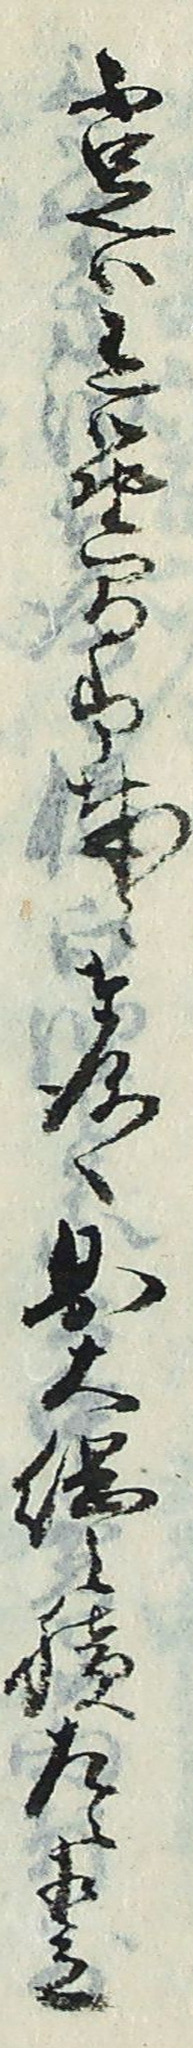不足は有御坐間布事に奉存候則大綱之積左に相立
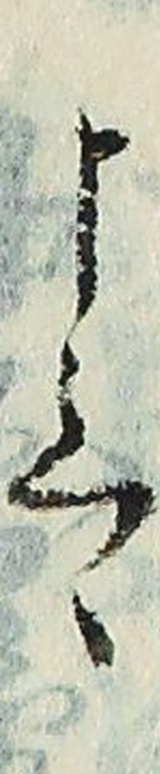申上候
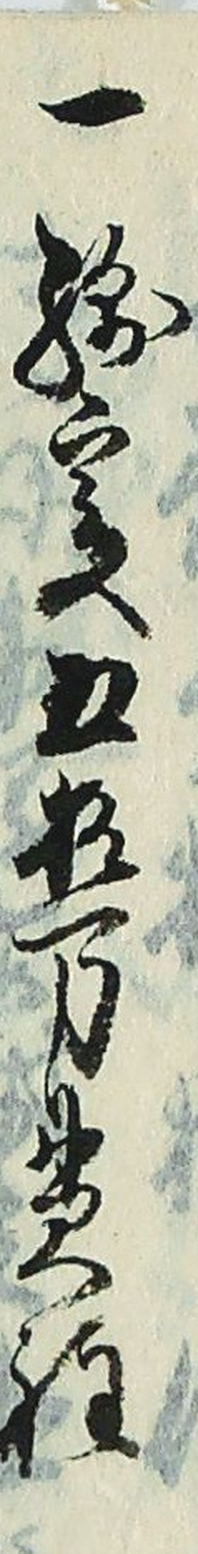一綿実五拾万貫程
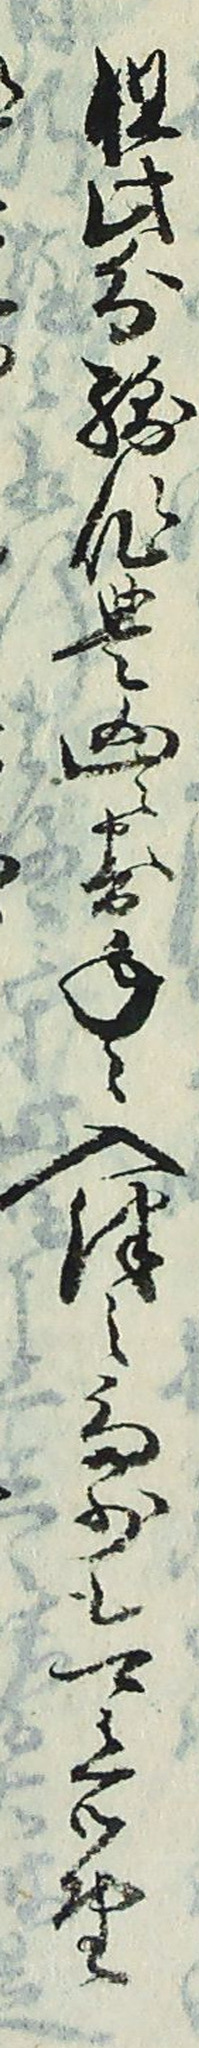但此分綿作豊凶に寄年々入津之多少も可有御坐
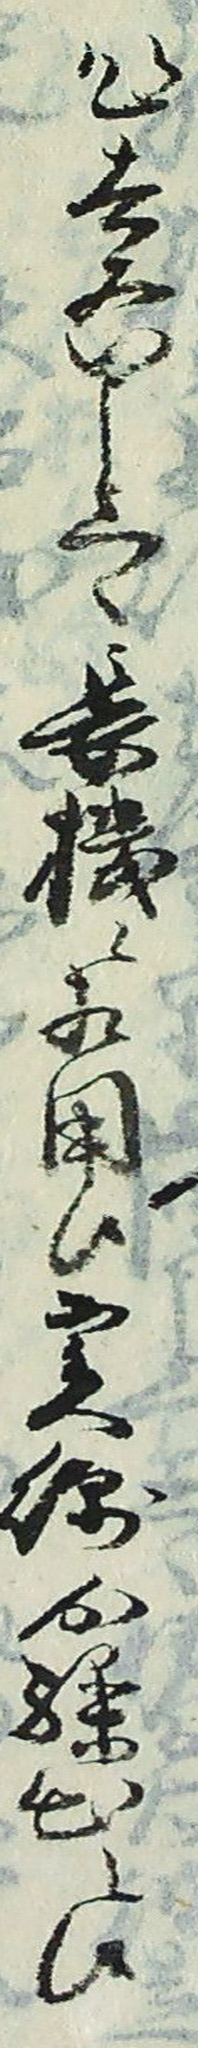乍去右申上候長機に相用候実綿ゟ繰出に候
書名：油稼御取究ニ附御箇條書テ以被仰渡南北同役申談御答書控
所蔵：鳴門教育大学 Naruto University of Education
